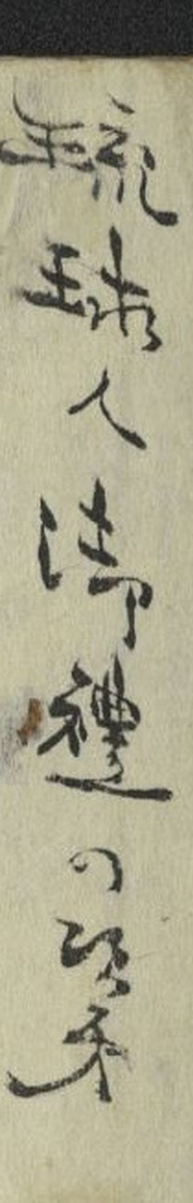琉球人御礼の次第
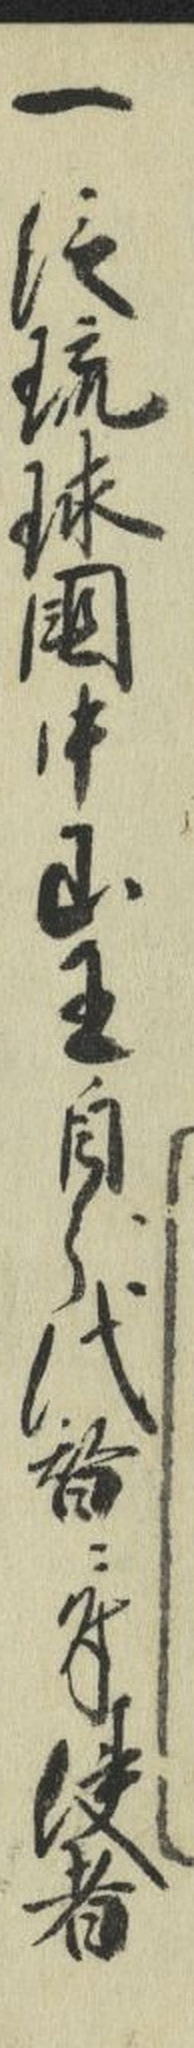一従琉球国中山王自分代替に付使者
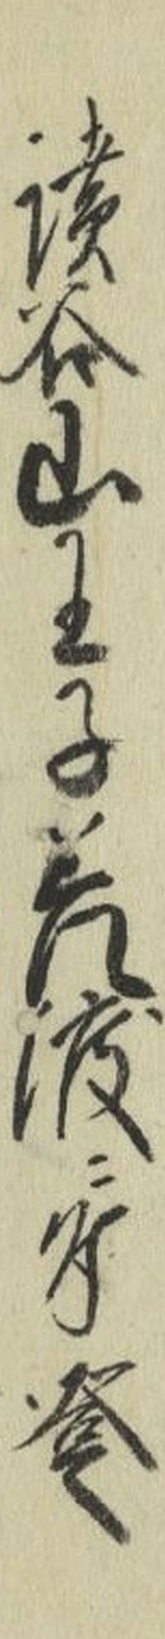読谷山王子差渡に付登

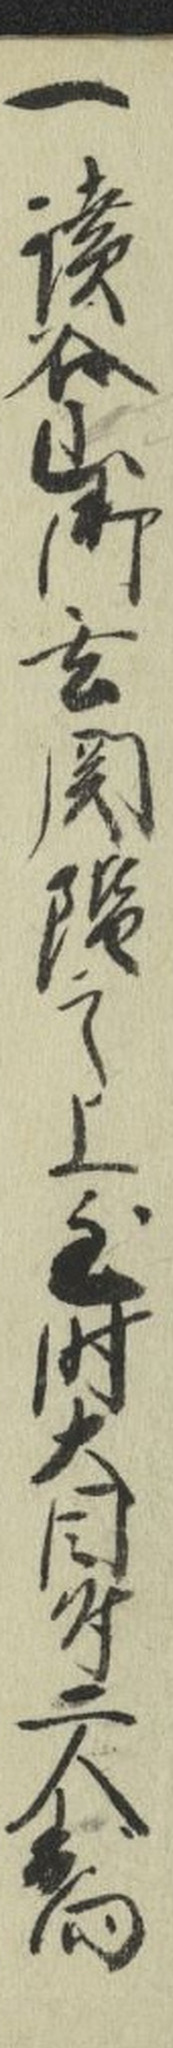一読谷山御玄関階之上至時大目付二人出向
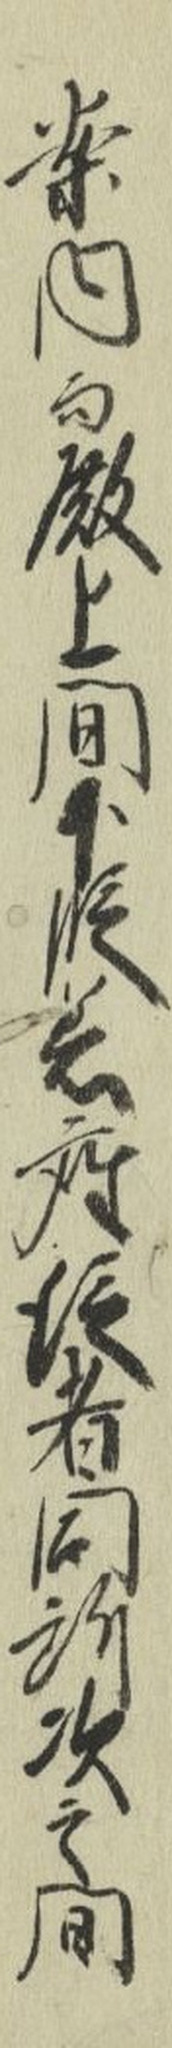案内而殿上間下段着座従者同所次之間
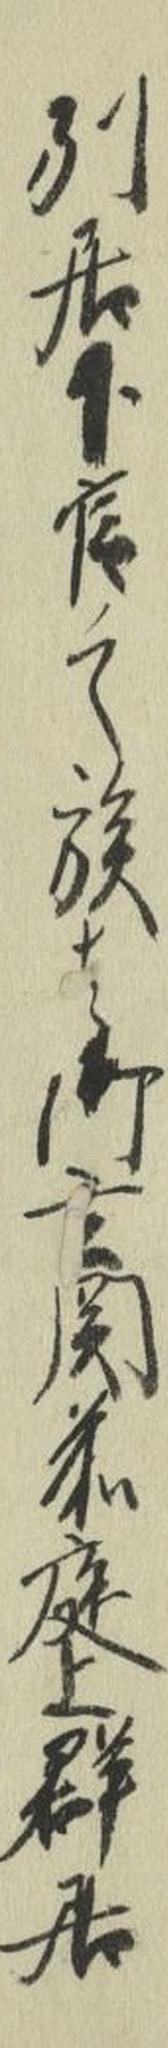列居下官之族は御玄関前庭上群居
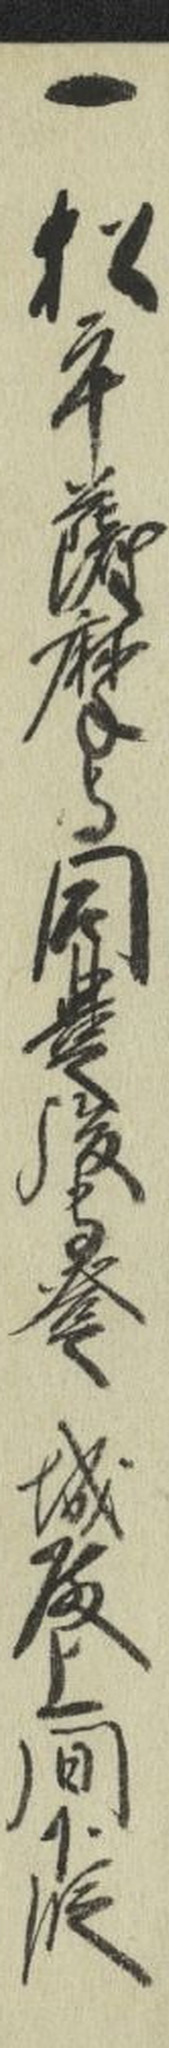一松平薩摩守同豊後守登城殿上間下段
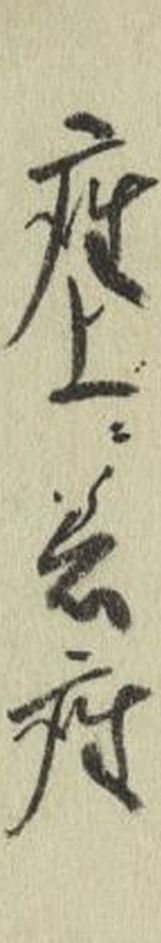座上に着座
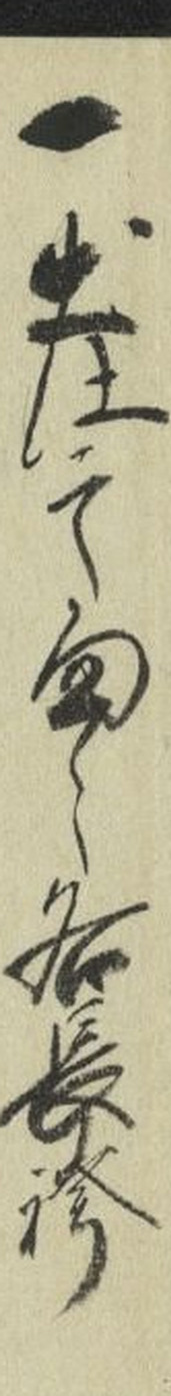一出仕之面々各長袴
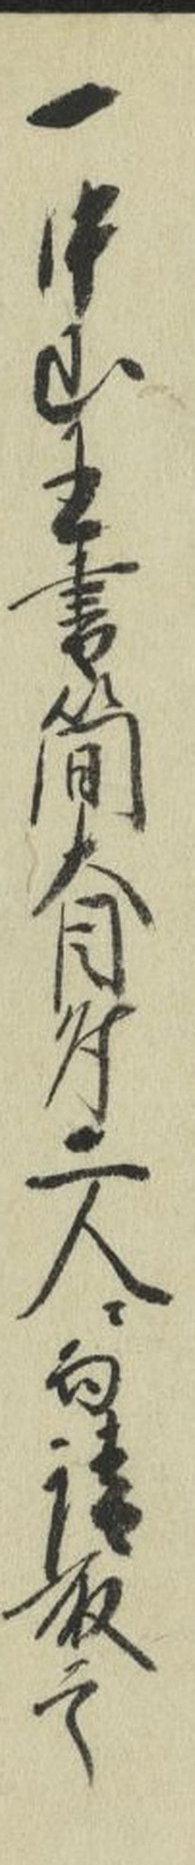一中山王書簡大目付二人に而請取之
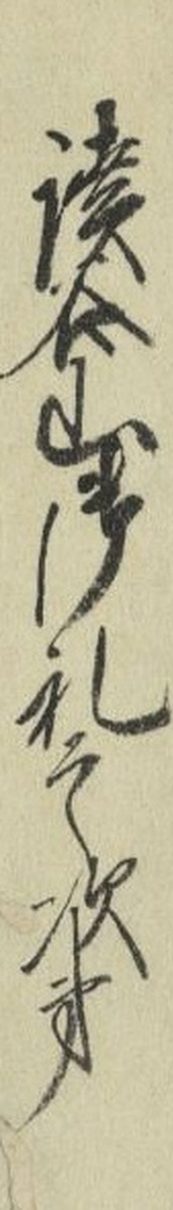読谷山御礼之次第
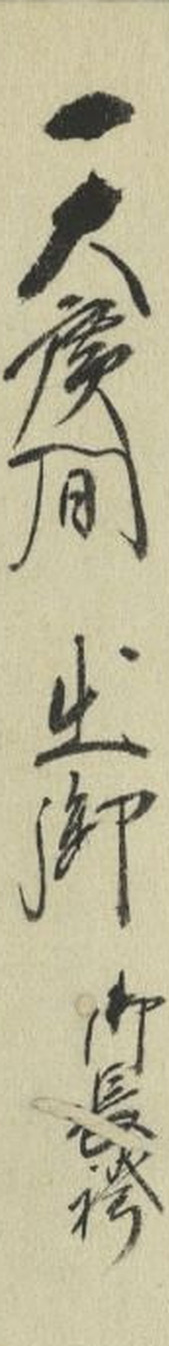一大広間出御御長袴
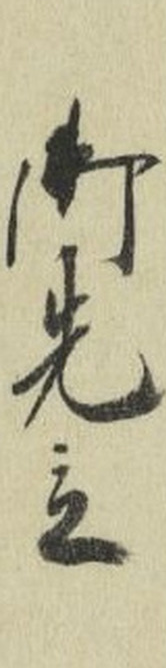御先立

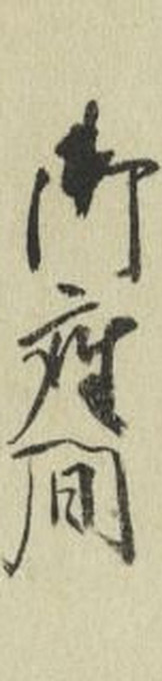御座間
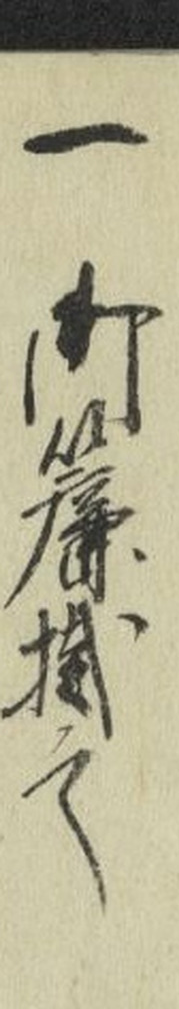一御簾掛之
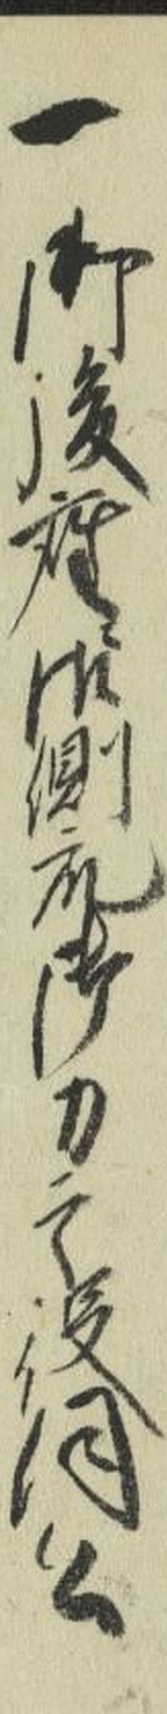一御後座に御側衆御刀之役伺候
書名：琉球人御礼の次第
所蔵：University of the Ryukyus Library
